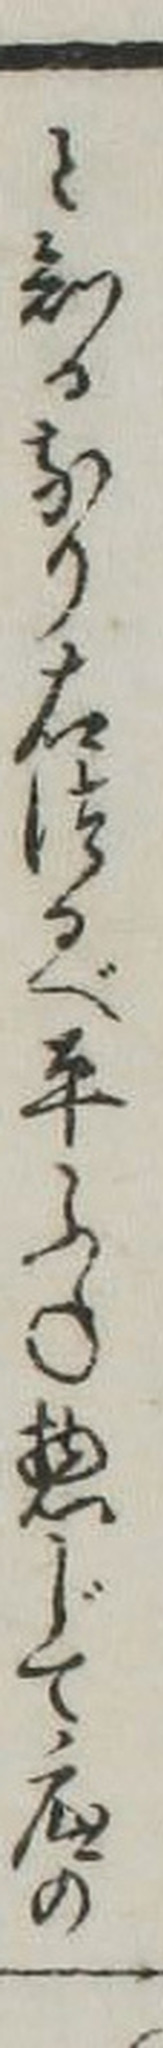と知るなり右つるべ平ふね惣じて底の
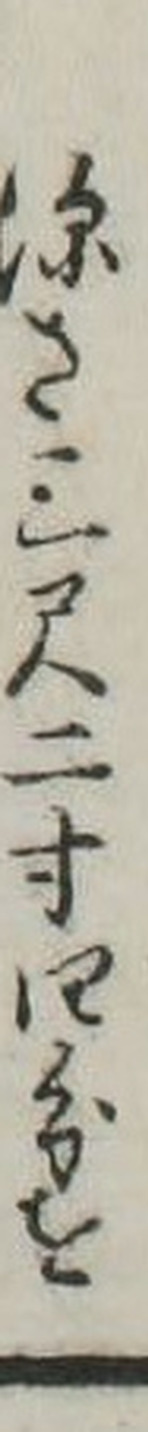寸深さ三尺二寸四分を
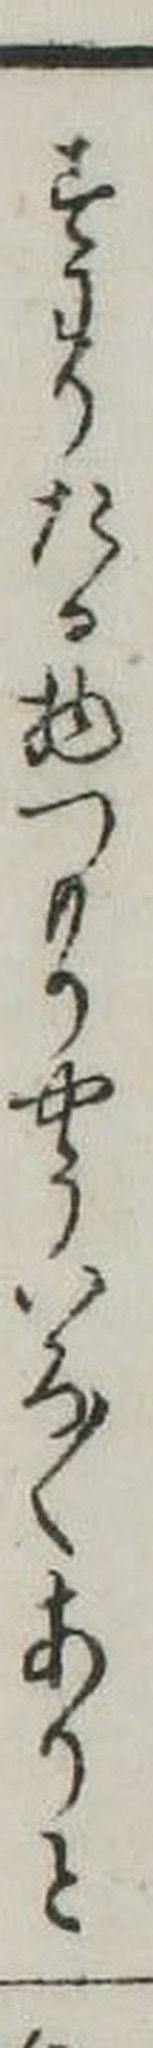すわりたる物つもりやういろ〳〵ありと
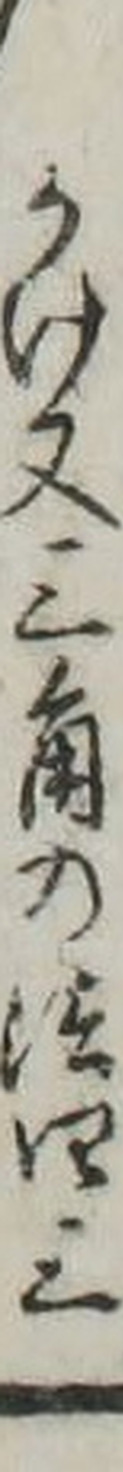四かけ又三角の法四三
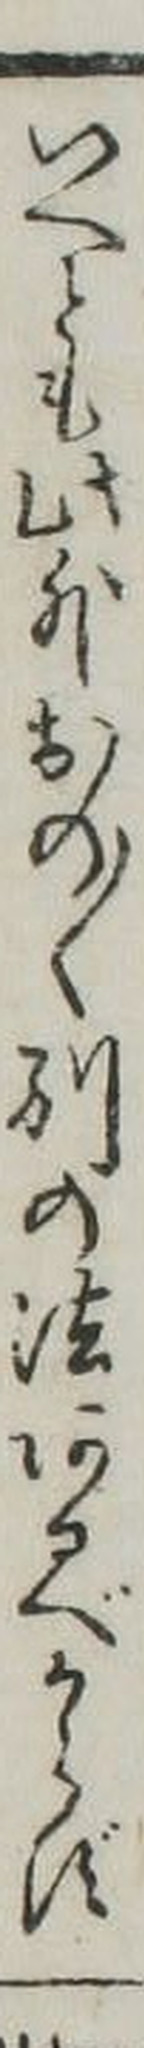いへとも此外おの〳〵別の法あるべからず
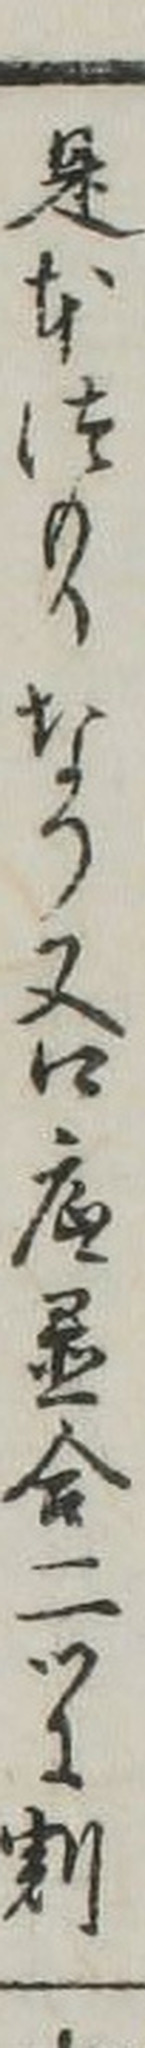是本つもりなり又口底置合二ツに割
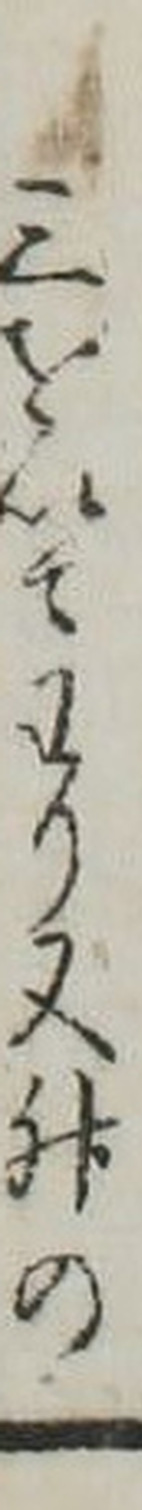二三を以てわり又升の
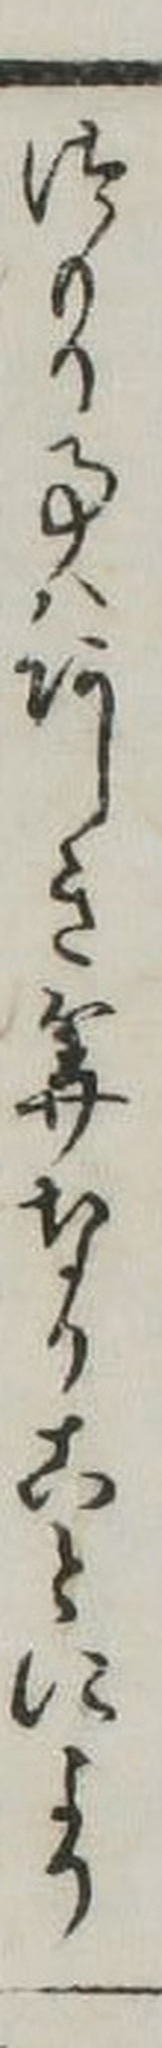つもり事はあしき算なりことにより
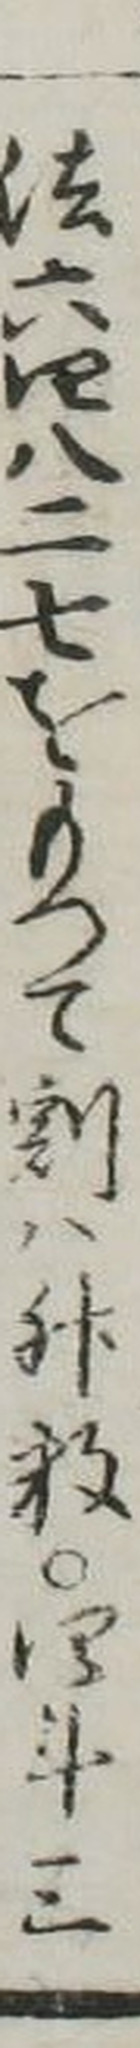法六四八二七をもつて割は升数〇四斗三
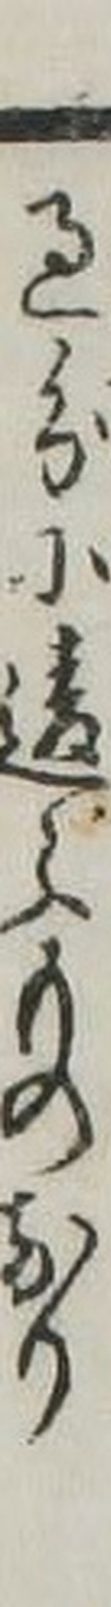過分に違ふものなり
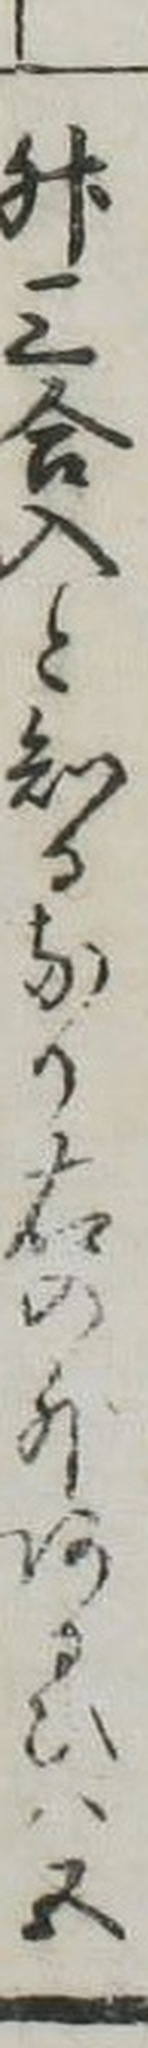升三合入と知るなり右の外あるひは五
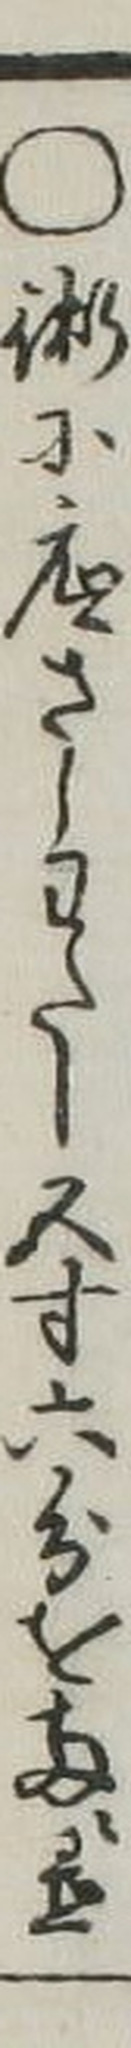○術に底さしわたし五寸六分を両に置
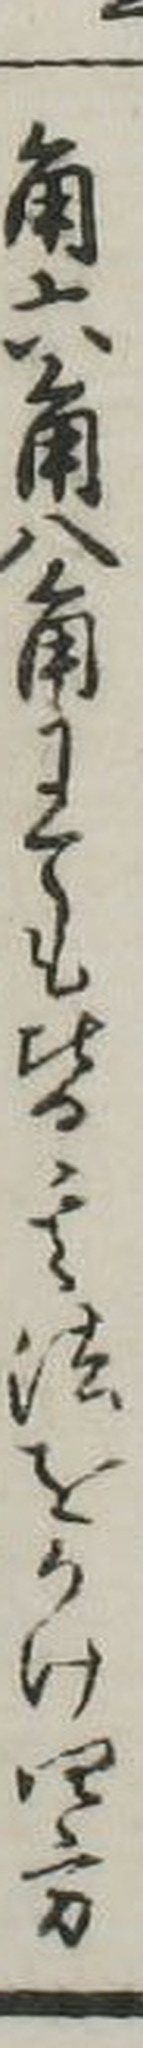角六角八角にても皆其法をかけ四方
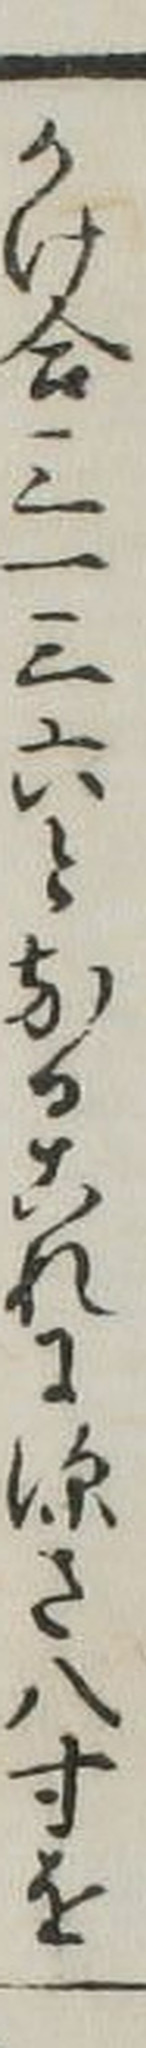かけ合三一三六となるこれに深さ八寸を
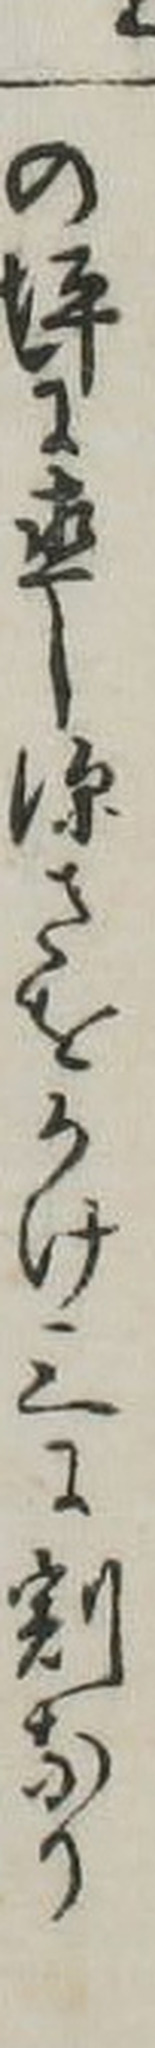の坪に直し深さをかけ三に割なり
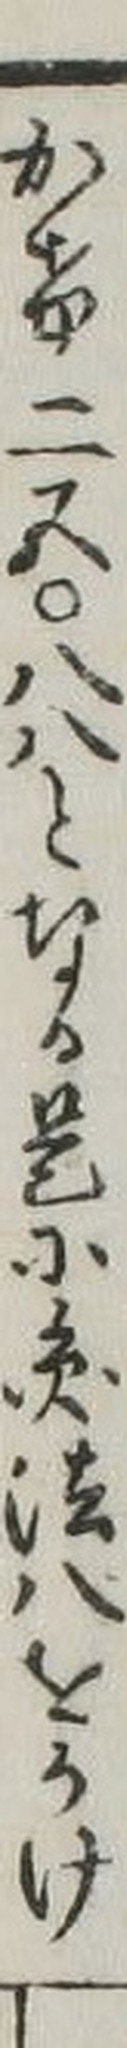かけ二五〇八八となる是に円法八をかけ
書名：宝玉塵劫記
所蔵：東京学芸大学教育コンテンツアーカイブ
